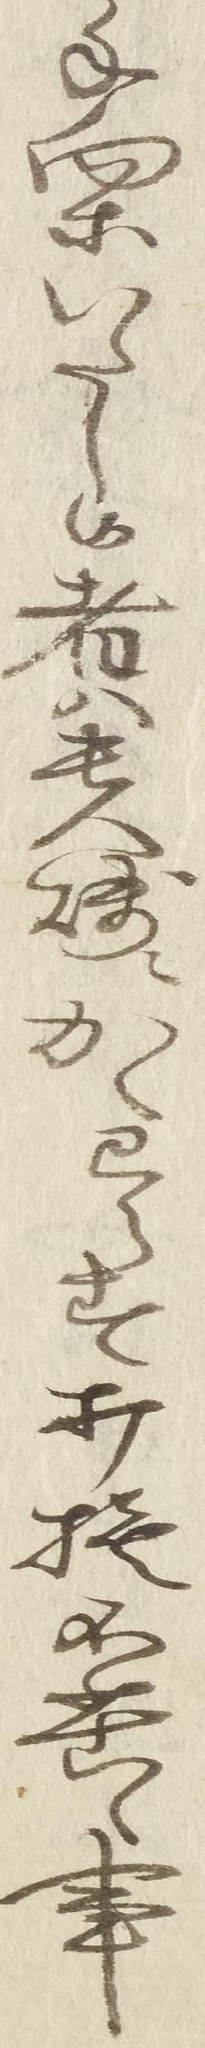手向等いたし候者は貴人賤にかゝわらす打捨不苦候事
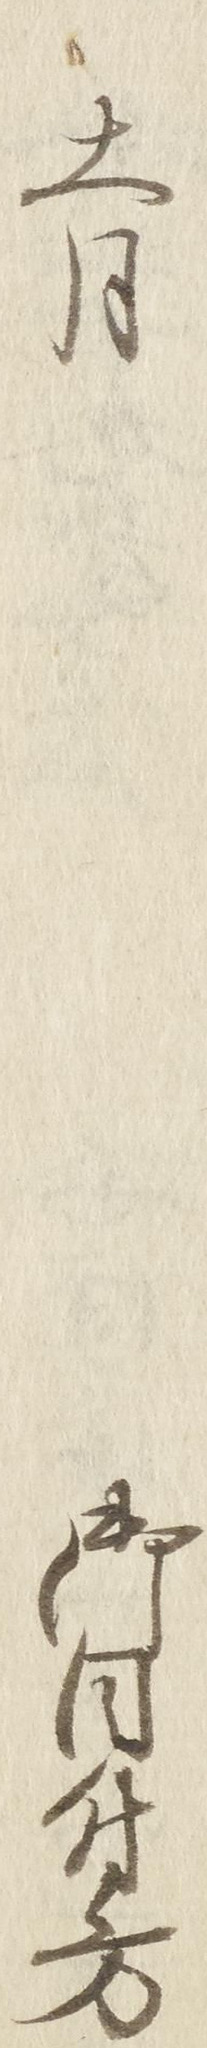十一月御目付方
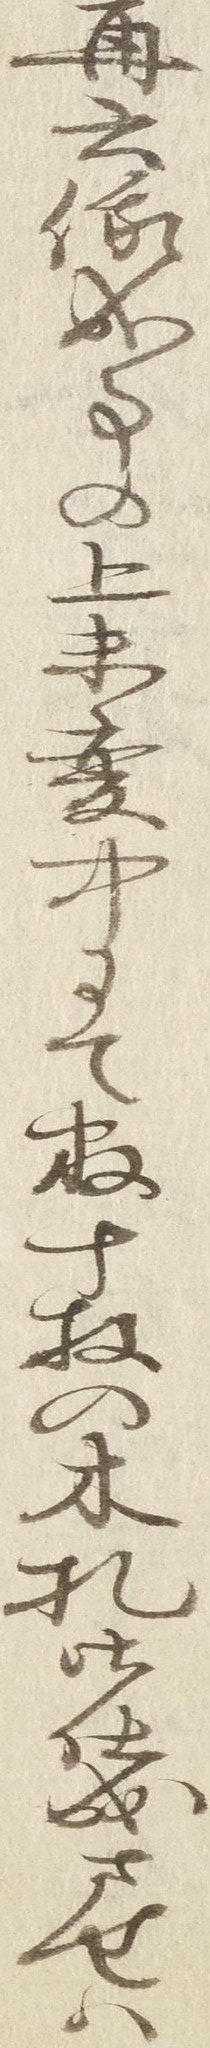再云俄成事の上未変中にて数十枚の木札御仕成させは
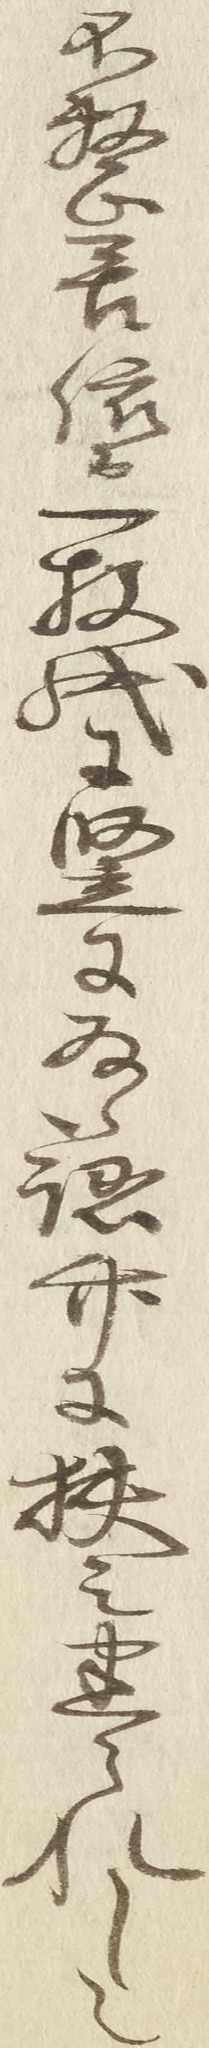不整筈依而一枚紙に竪に為御認竹に挟み建られし也
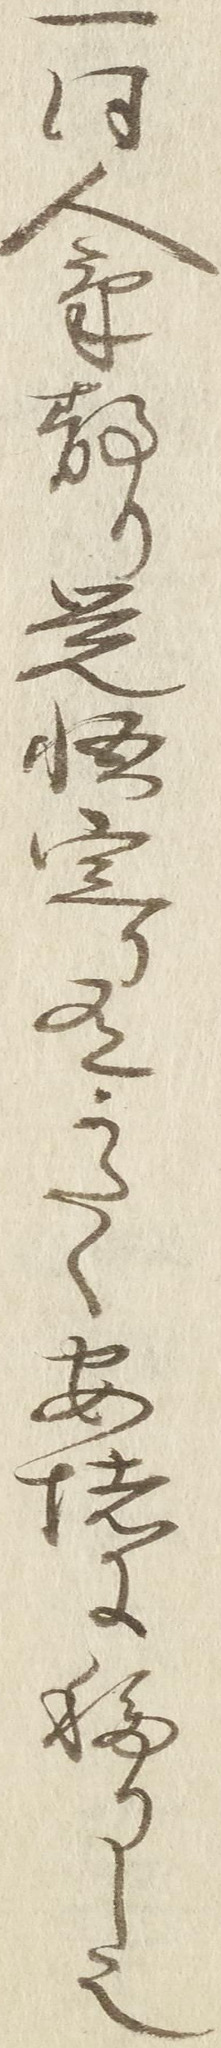一同人気静り覚悟定り有かたく安堵に移りし也
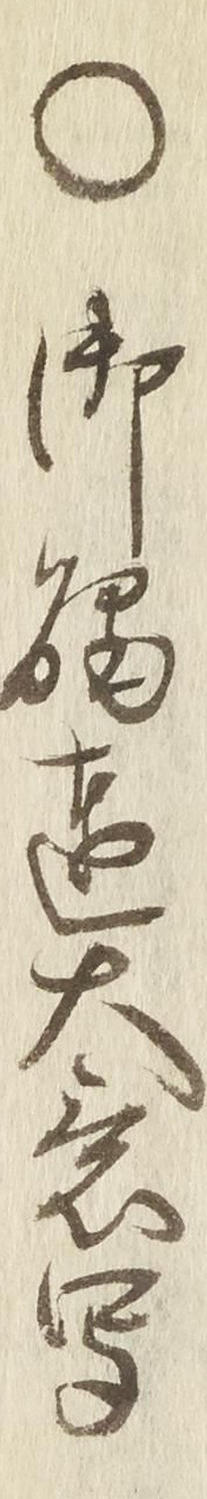〇御触達大意写
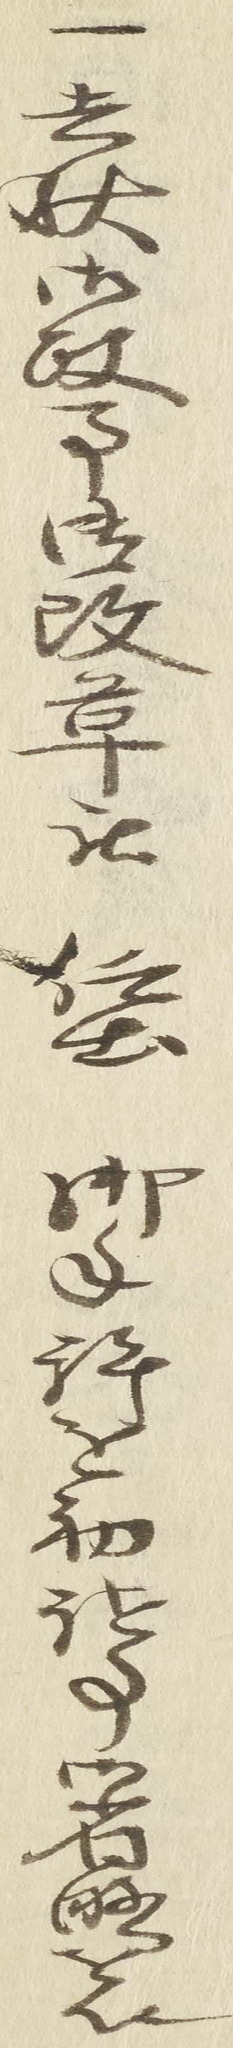一去秋御政事御改革被仰出御手許を初諸事御省略を以
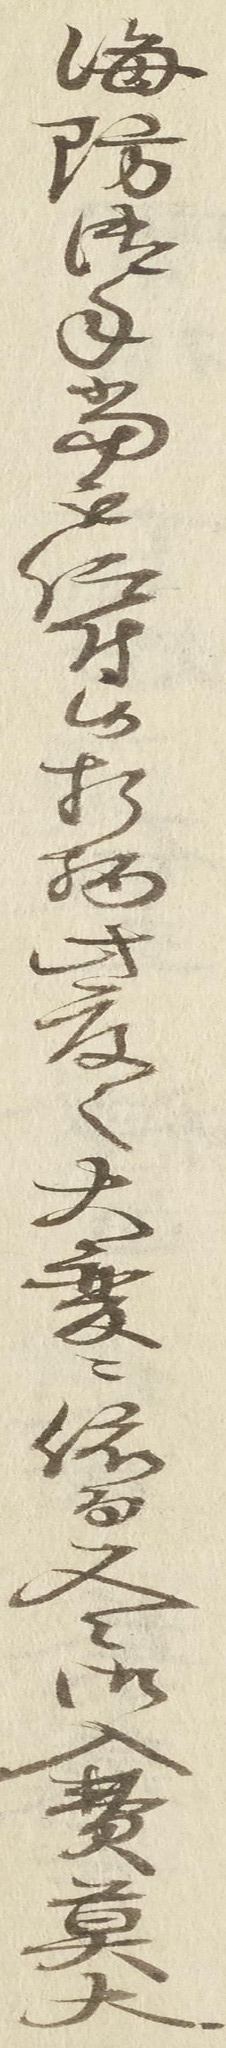海防御手当被仰付候折柄此度之大変に依而又々御入費莫大
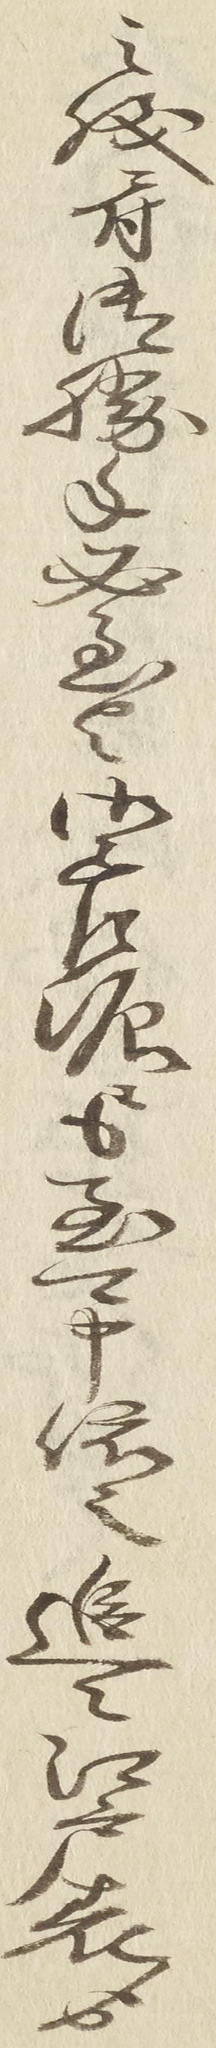之儀に付御勝手必至と御差泥にも至可申依之追々江戸表より
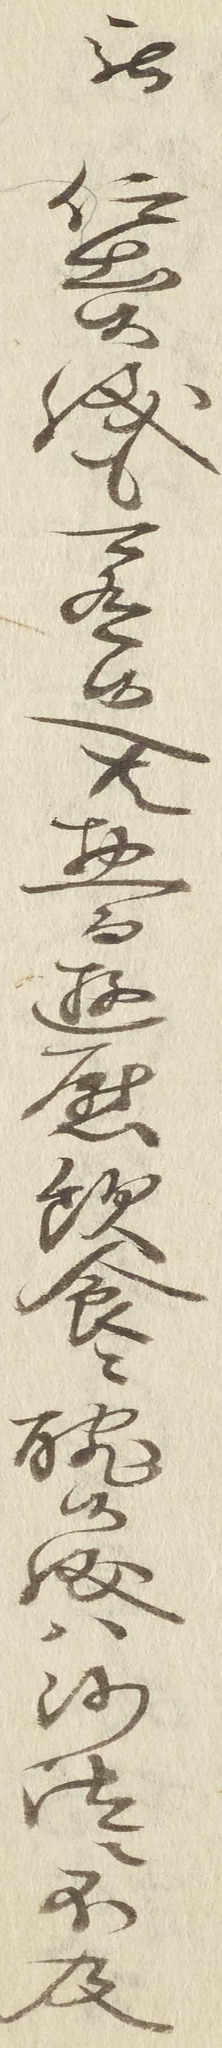被仰出候儀も可有候へ共惣而遊慰飲食に耽候儀は沙汰に不及
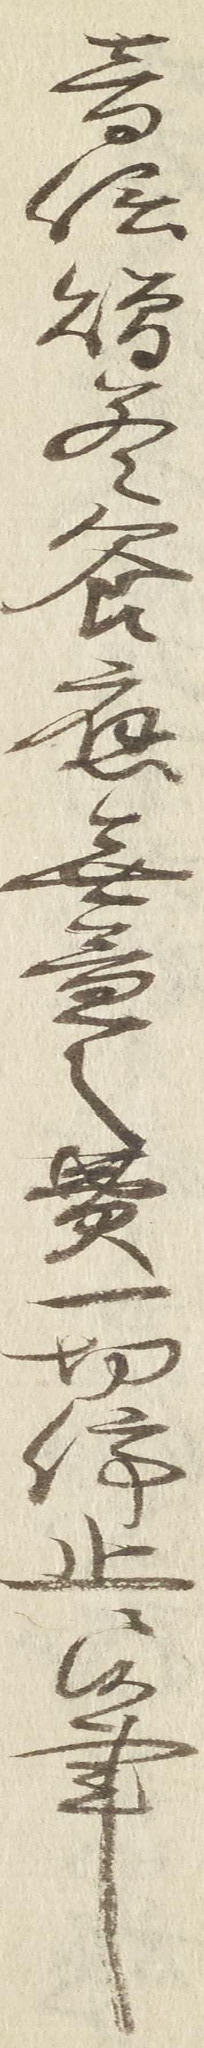音信贈答饗応無益之費一切停止に候事
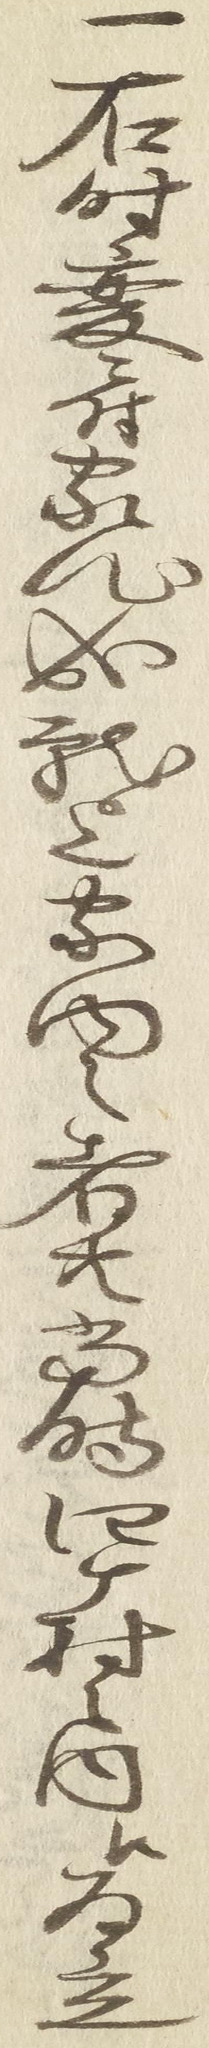一右時変に付家作成就上家内之者共当時四ヶ村之内え為立
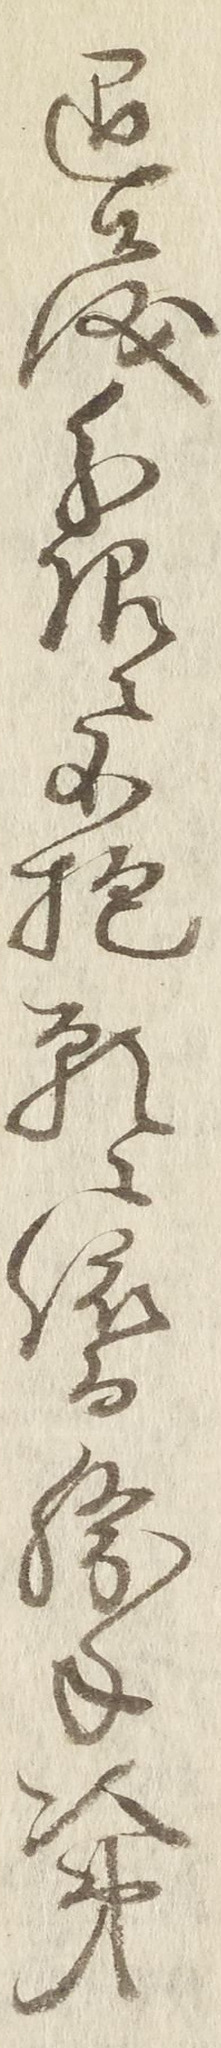退候儀分限に不抱願に依而勝手次第
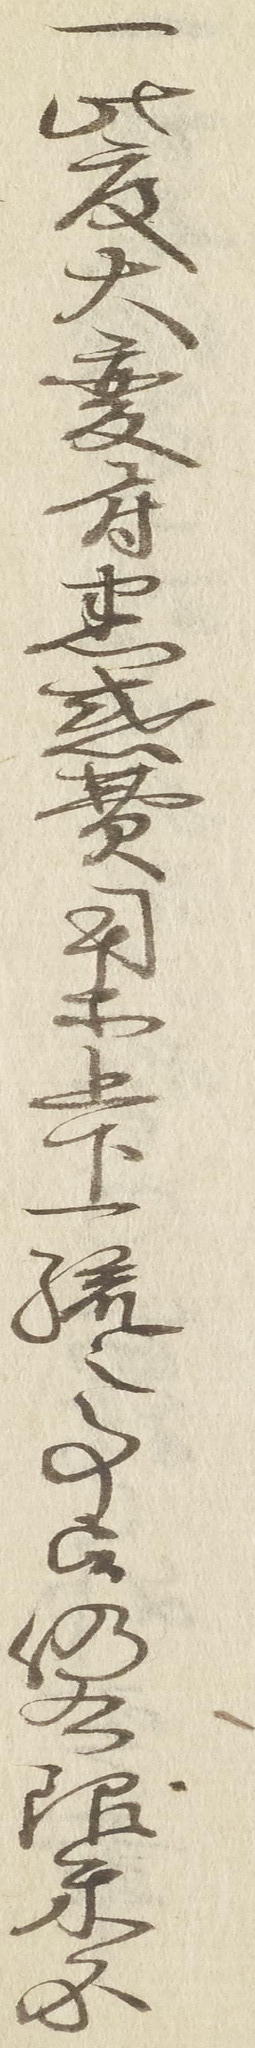一此度大変に付迷惑費用等上下一統之事に候仍右限米不
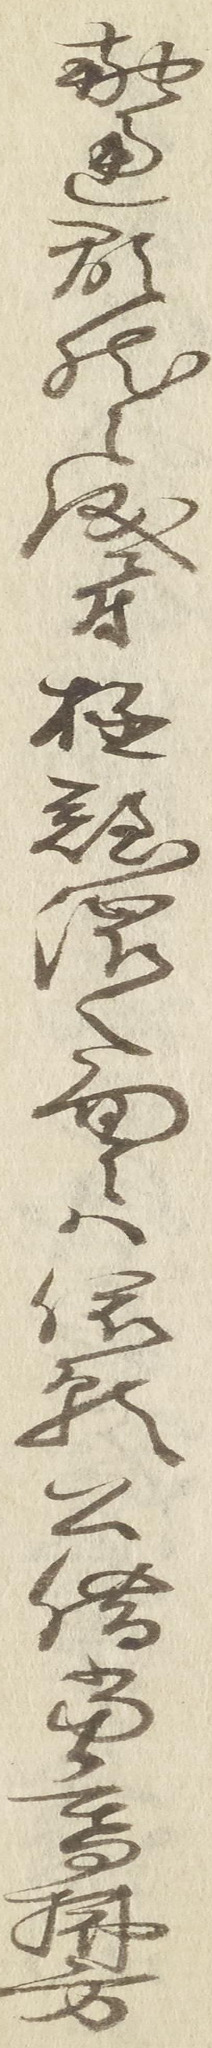融通顕然之儀に付極難渋之面々は仍願公借当暮払方
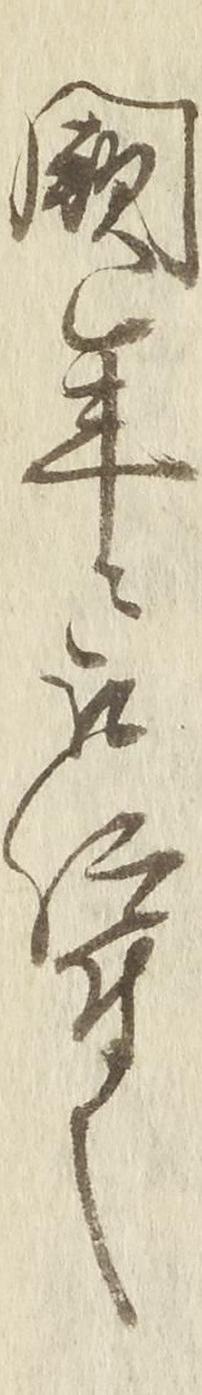闕年に被仰付之
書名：地震記　上
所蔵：東京大学地震研究所図書室 Earthquake Research Institute Library, The University of Tokyo, JAPAN
